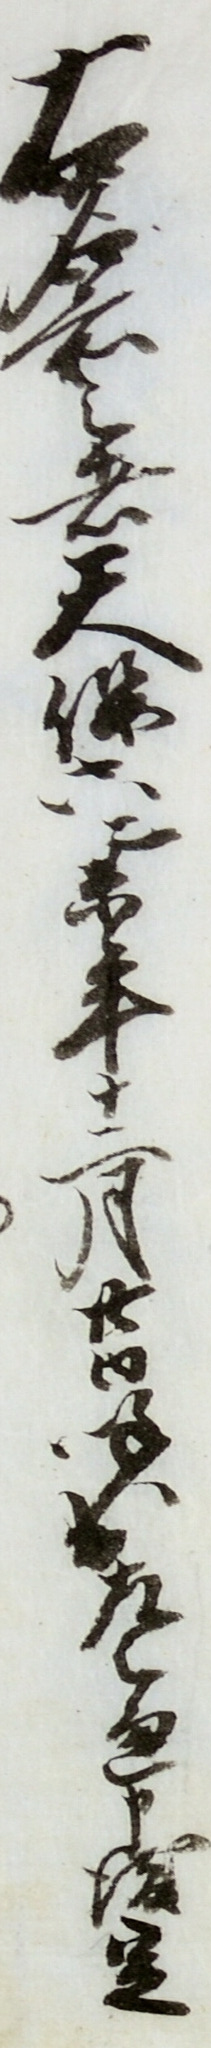右名前之者天保六乙未十二月廿日呼出左之通申渡定
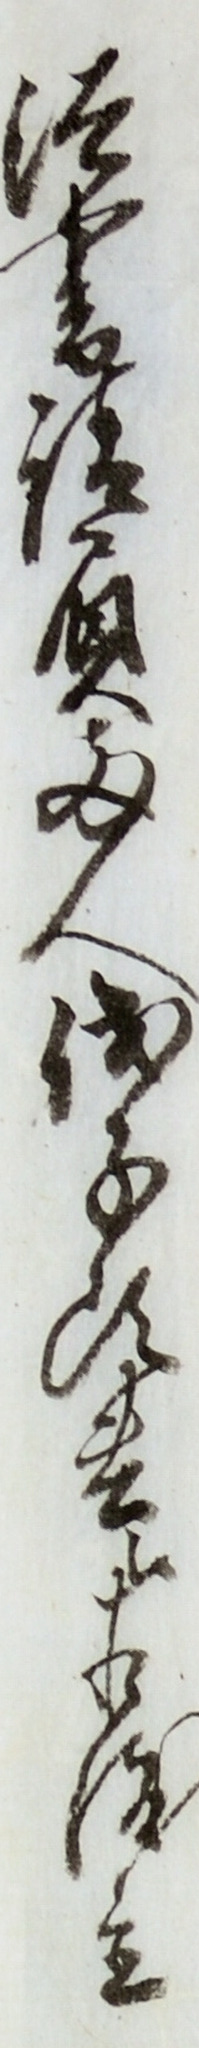法書請負両人伐子頭共江相渡置
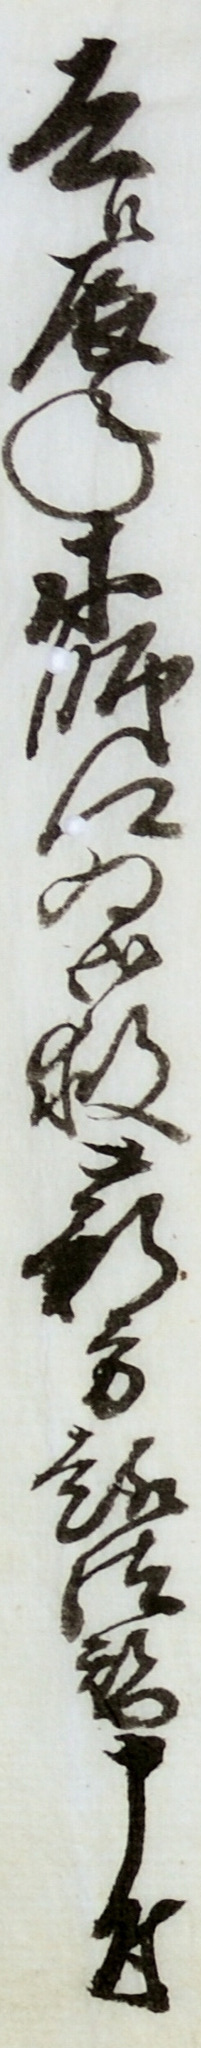去ル辰年木師郷為御救薪方趣法替申付

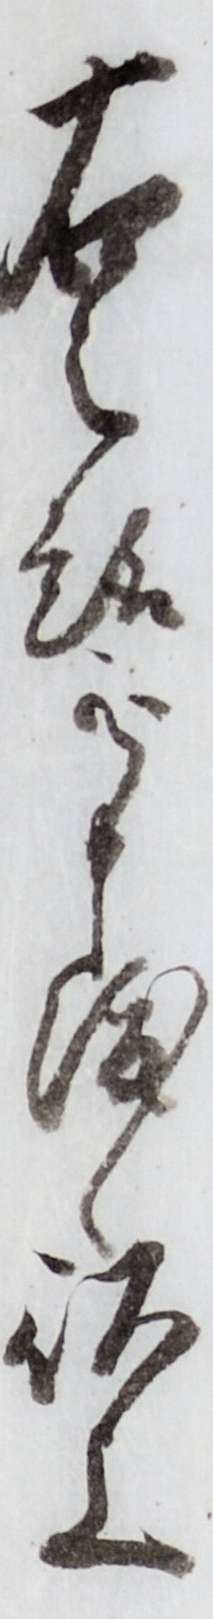右之趣可申渡候以上
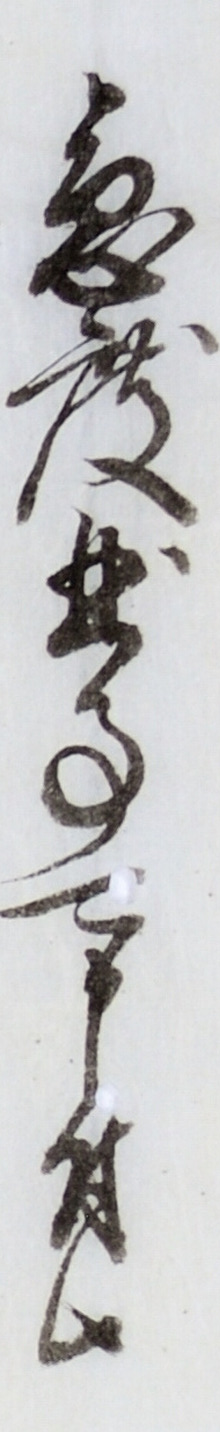急度曲事可申付候
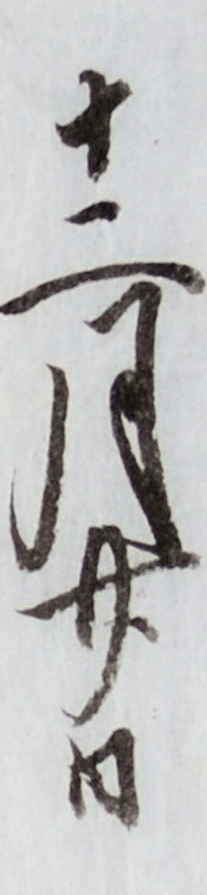十二月廿日
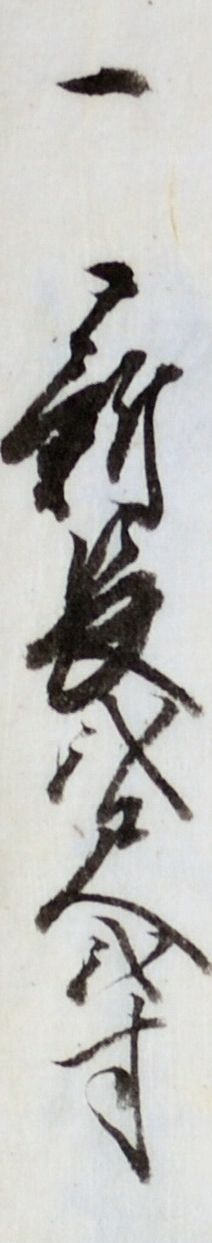一薪長弐尺弐寸
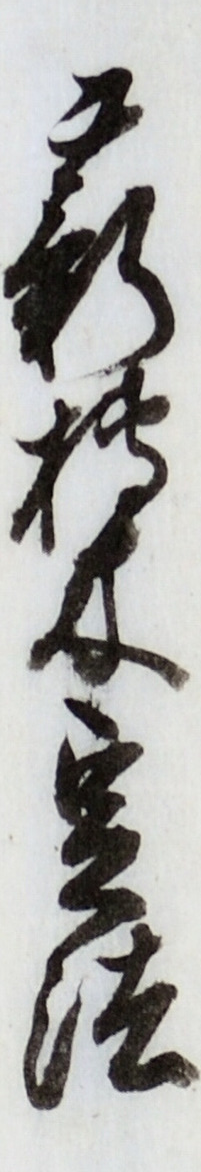薪樽木定法
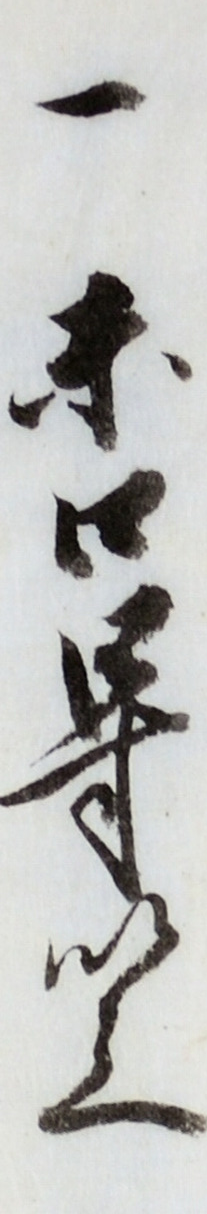一末口四寸以上
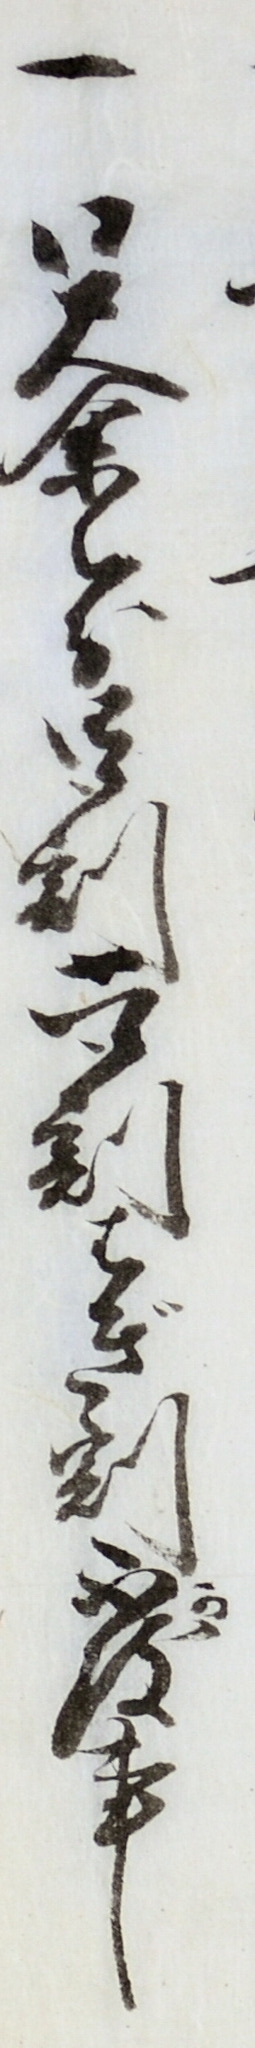一同尺余之分四ツ割六ツ割はぎ割不可及事
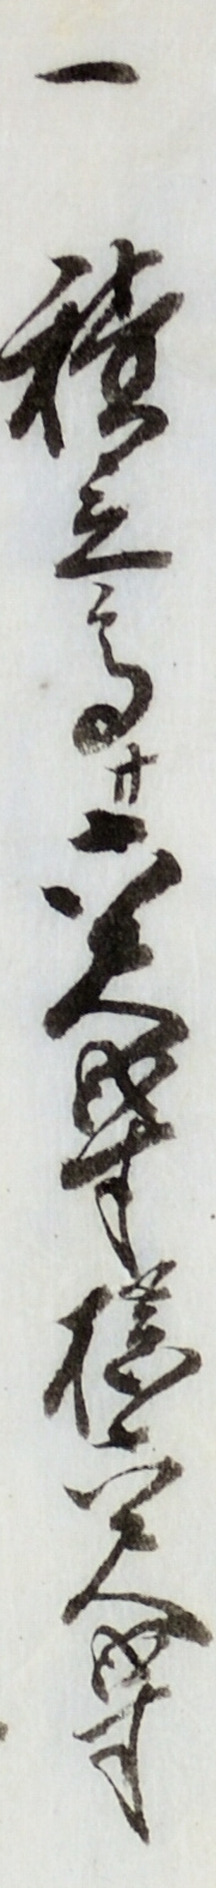一積立高サ六尺弐寸横六尺弐寸
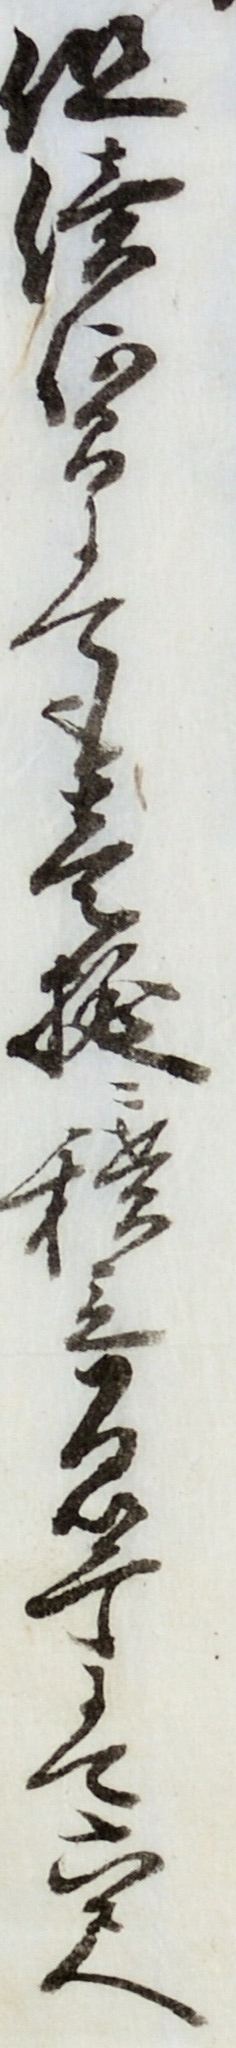但続何間にても壱挺ニ積立間竿にて六尺
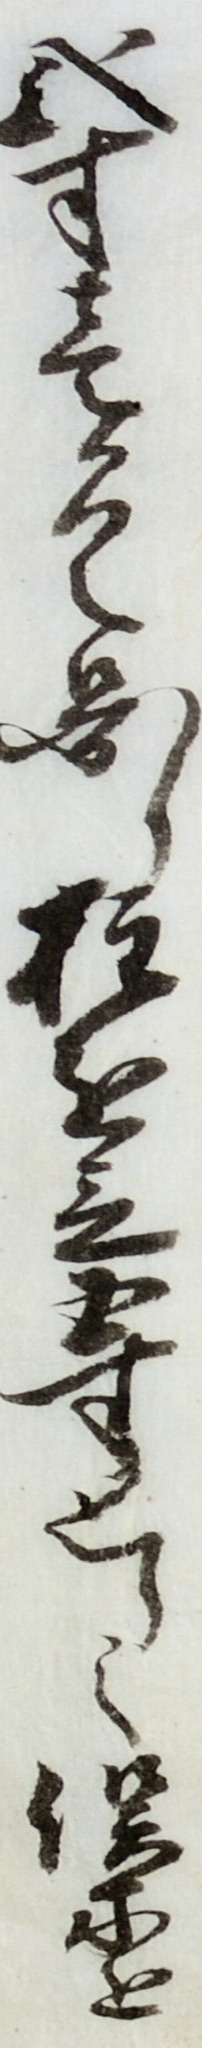弐寸壱間之図り柱を立五寸とり之俣木を
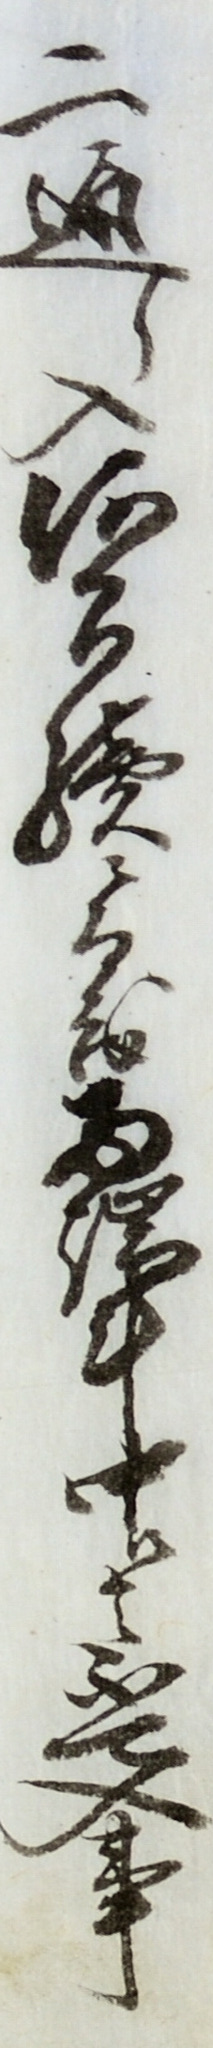二通り入何間続ニ而茂両端計中江者不可入事
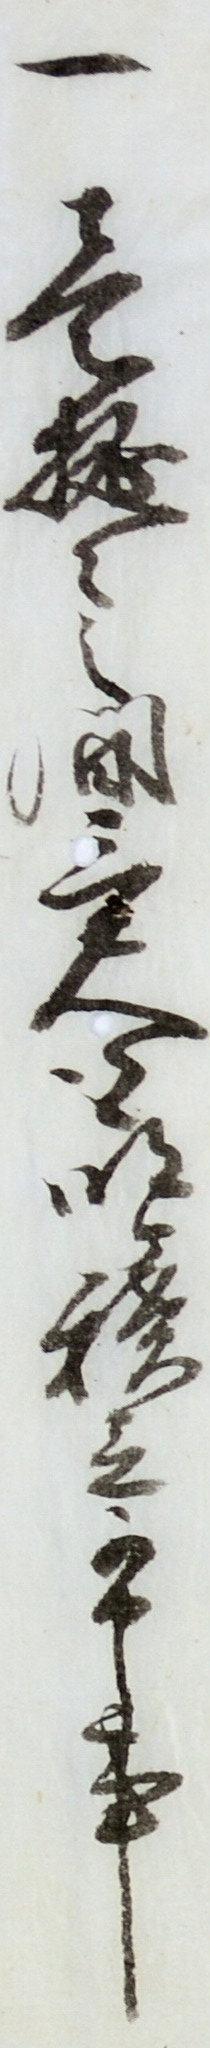一壱挺々之間三尺ツヽ明ヶ積立可申事

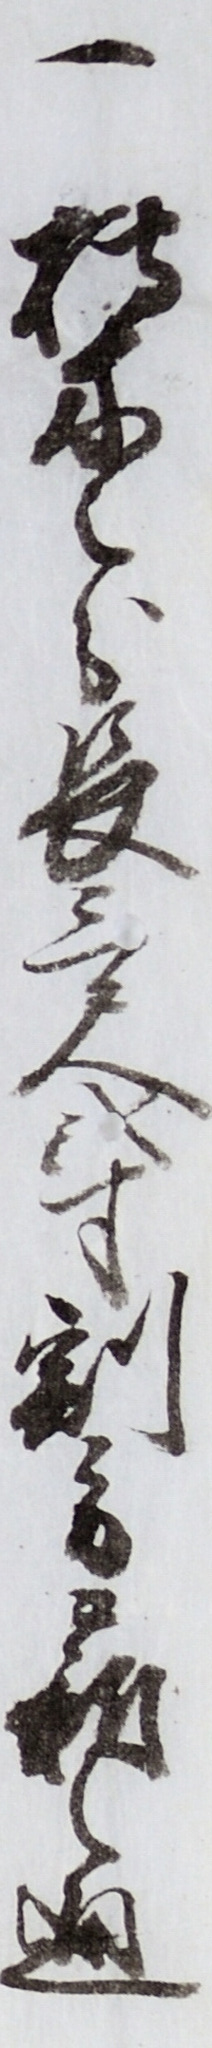一樽木之分長三尺弐寸割方薪之通
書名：御薪方掟控
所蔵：伊那市立高遠町図書館・合同会社AMANE
